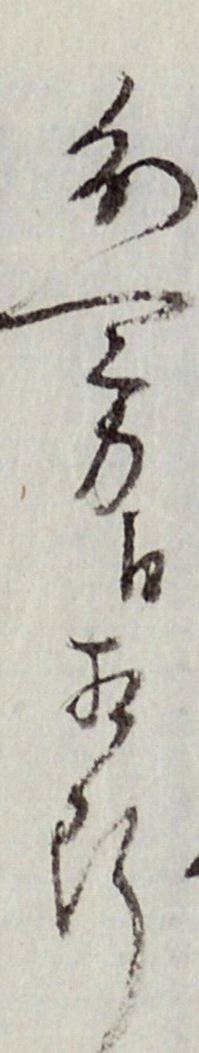分一方江相断
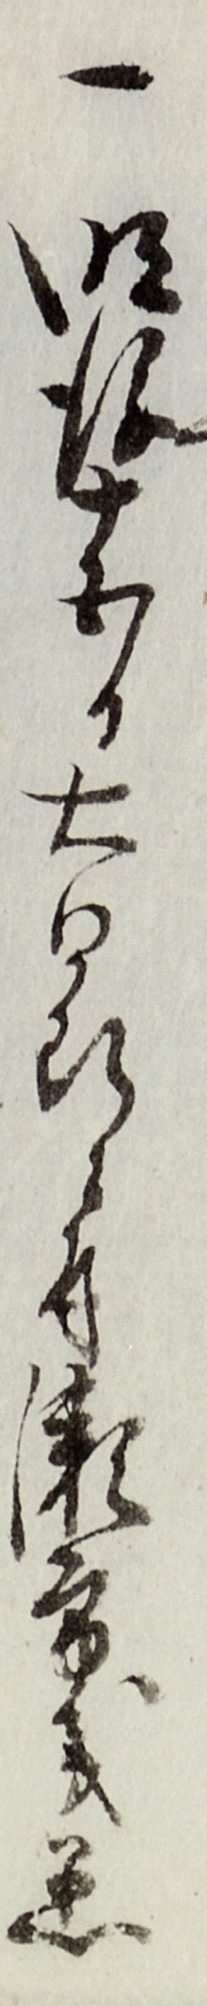一明後十五日右同断ニ付瀬市義黒
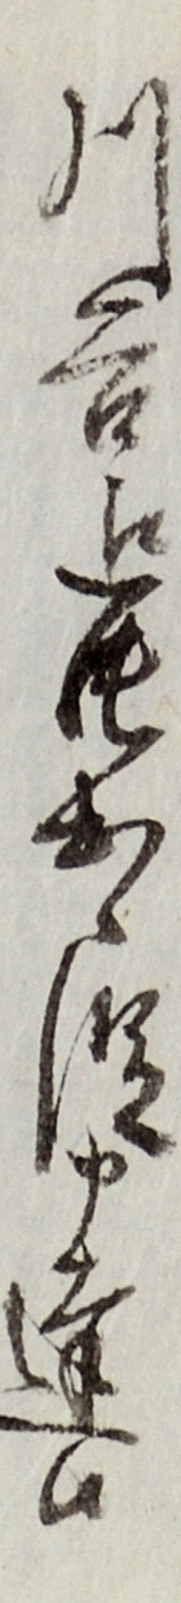川谷江罷出候段申達候
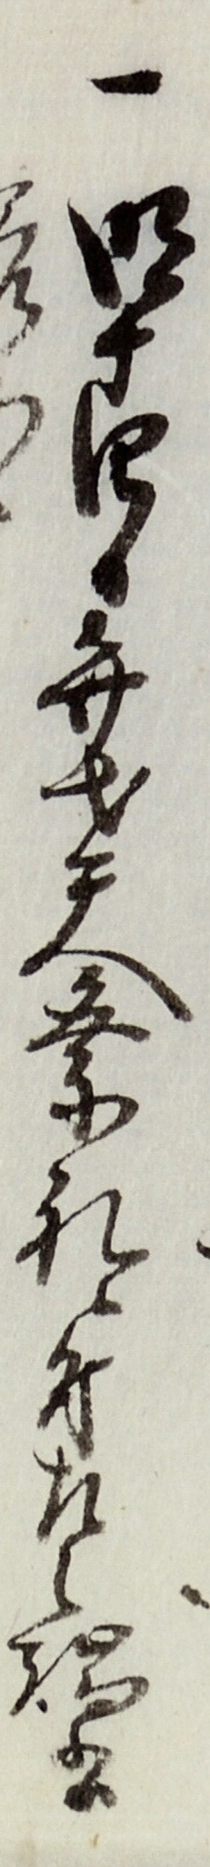一明十四日弁才天祭礼ニ付左之端書
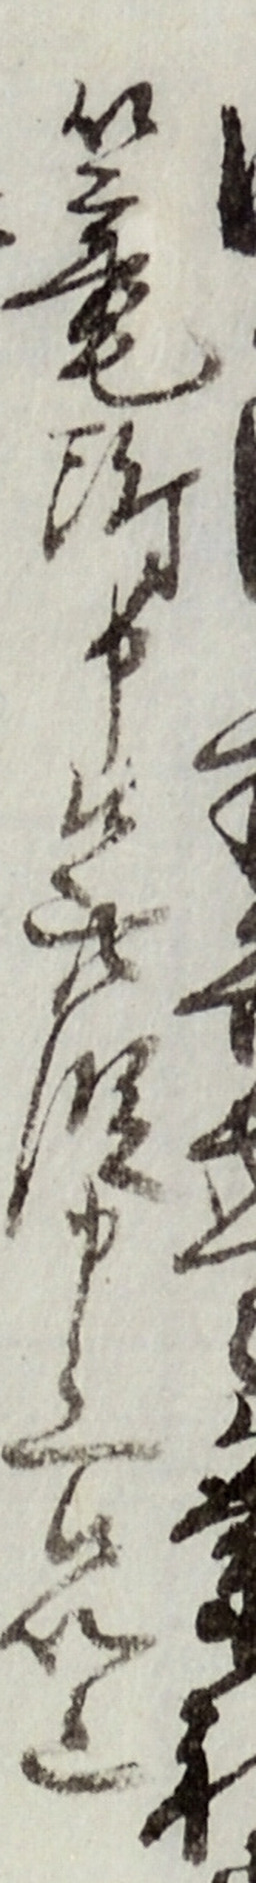篭付申候此段申上候以上
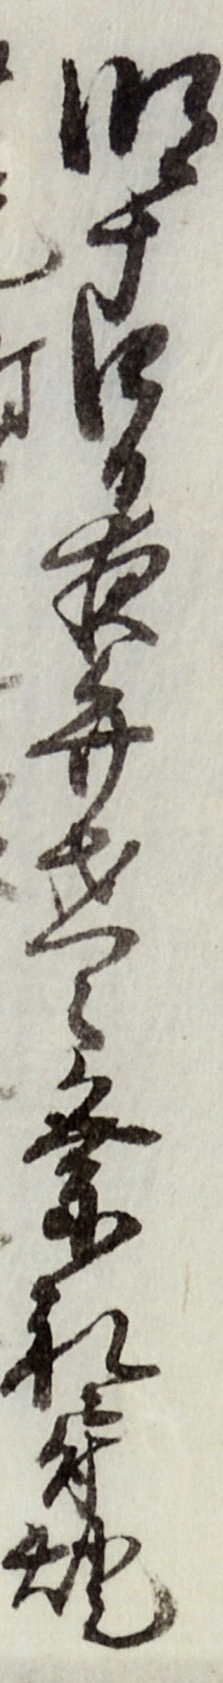明十四日夜弁才天祭礼ニ付燈
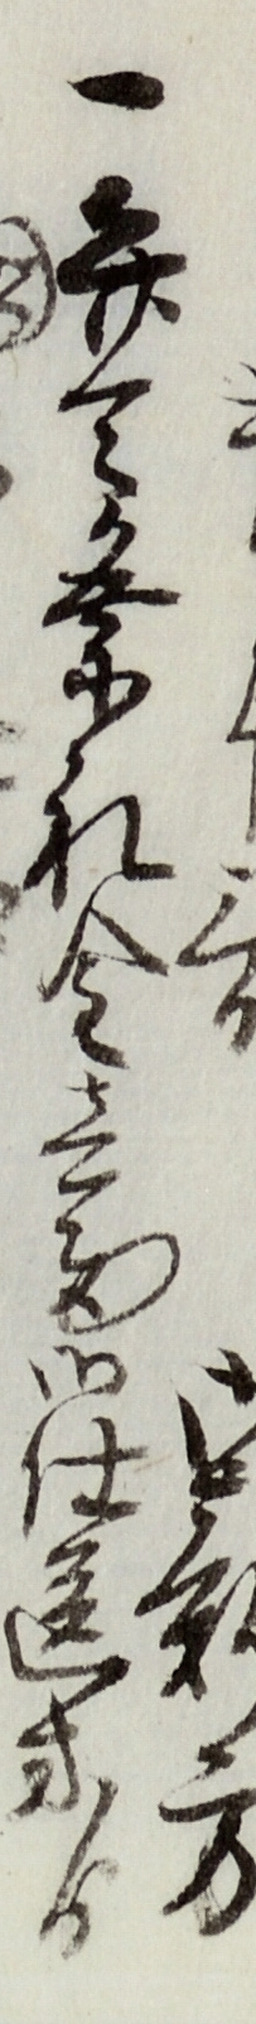一弁才天祭礼金壱両御仕送方ゟ
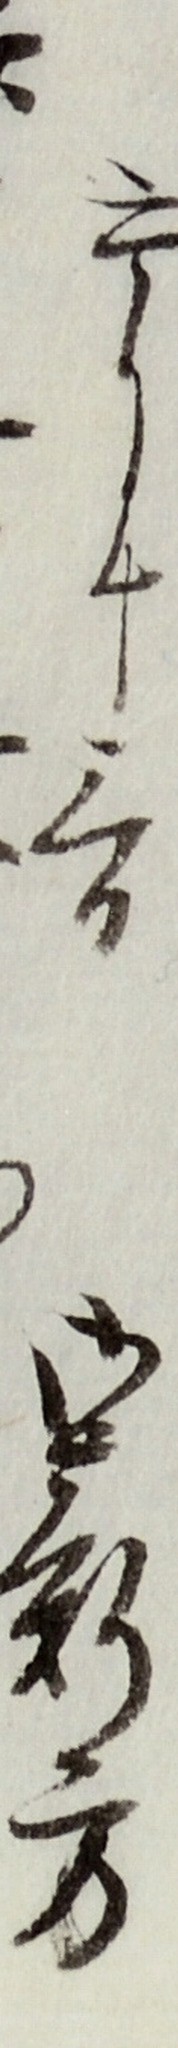六月十三日御薪方
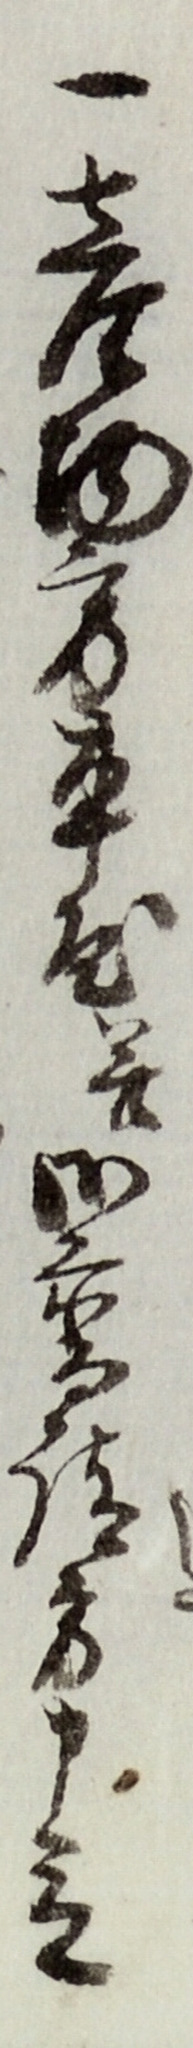一産物方車屋并御普請方申立
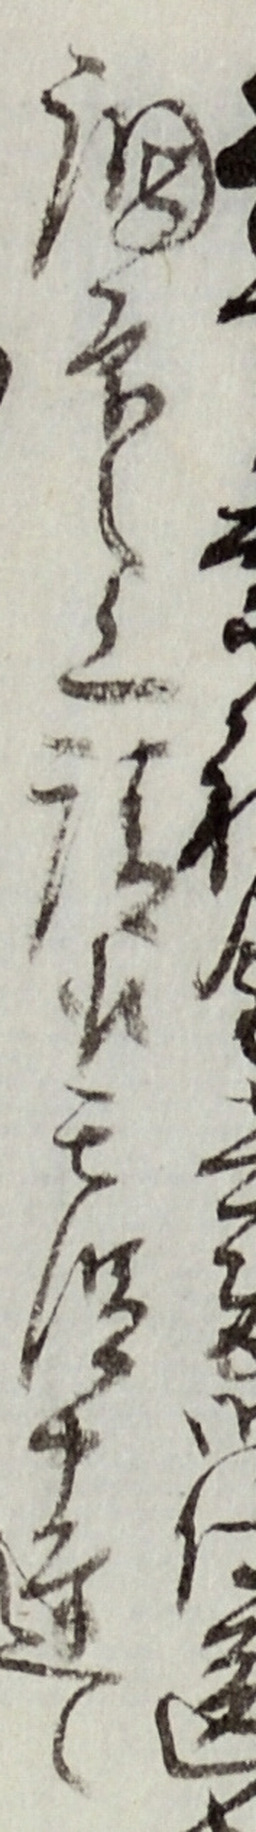調印之上請取其段申達候
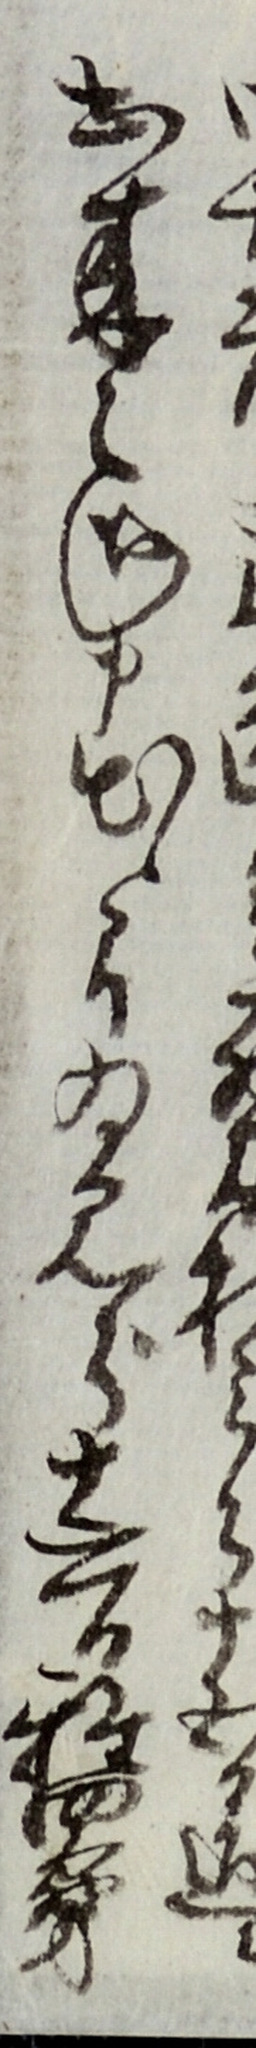出来候趣申出候間為見分十六日雅四郎方
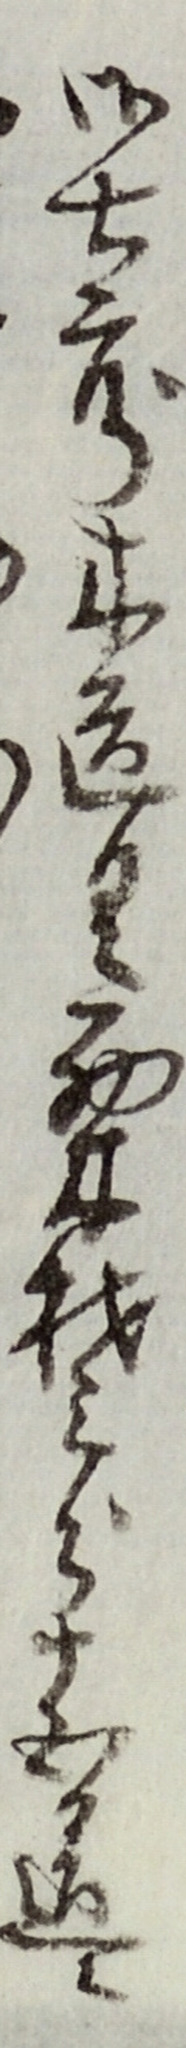御土蔵木道具栗材之分十五日迄ニ

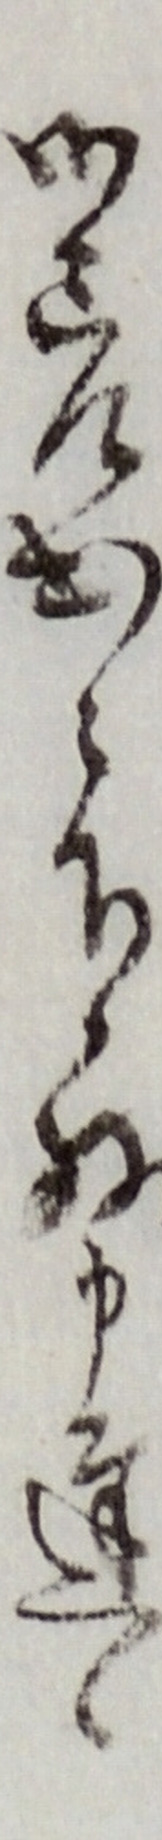御差出被下候様申達候
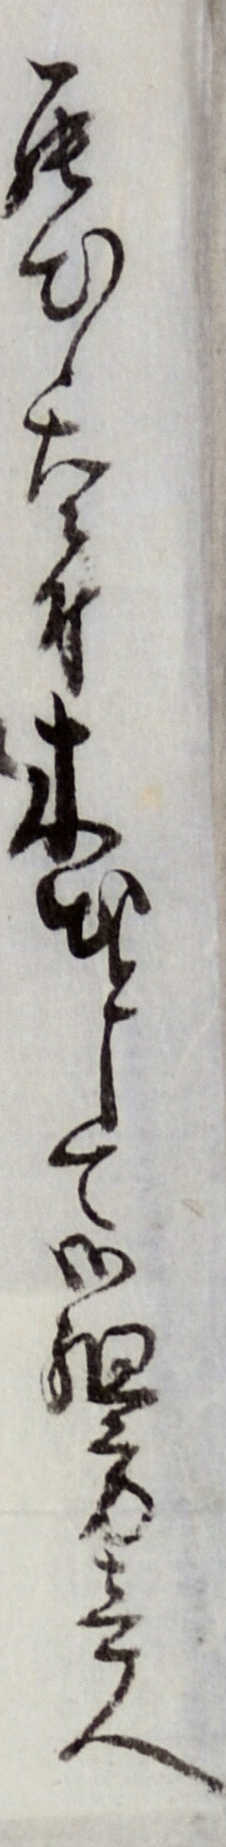罷出候右ニ付木出として御組方壱人
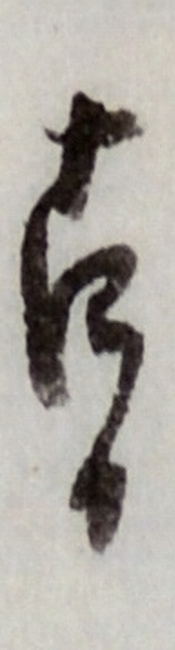十四日
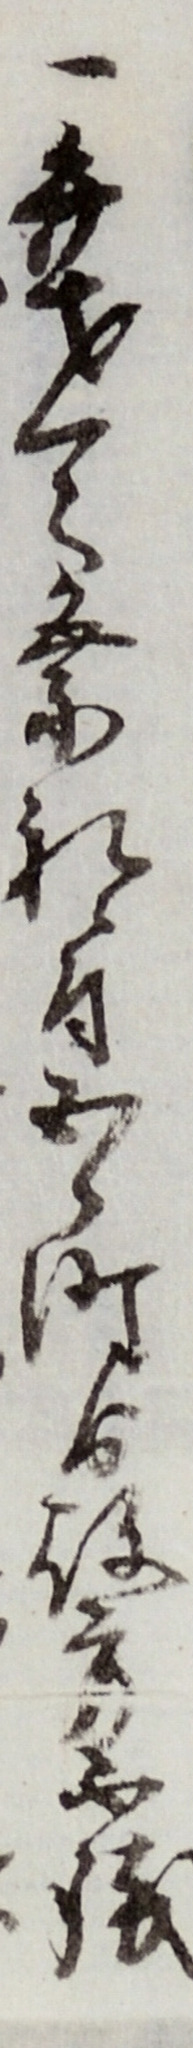一弁才天祭礼ニ付五ケ町ゟ役方不残
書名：御山方御薪方諸事御用留
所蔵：伊那市立高遠町図書館・合同会社AMANE
